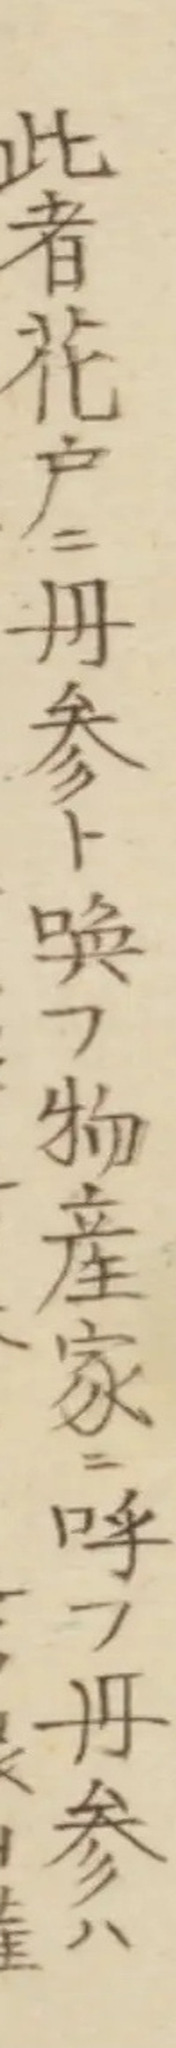此者花戸ニ丹参ト喚フ物産家ニ呼フ丹参ハ
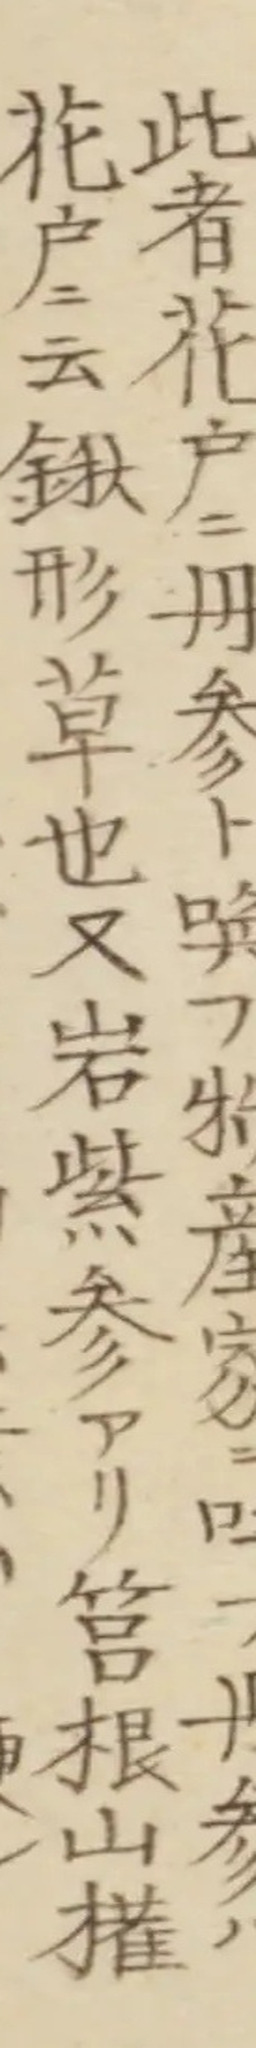花戸ニ云鍬形草也又岩紫参アリ筥根山権
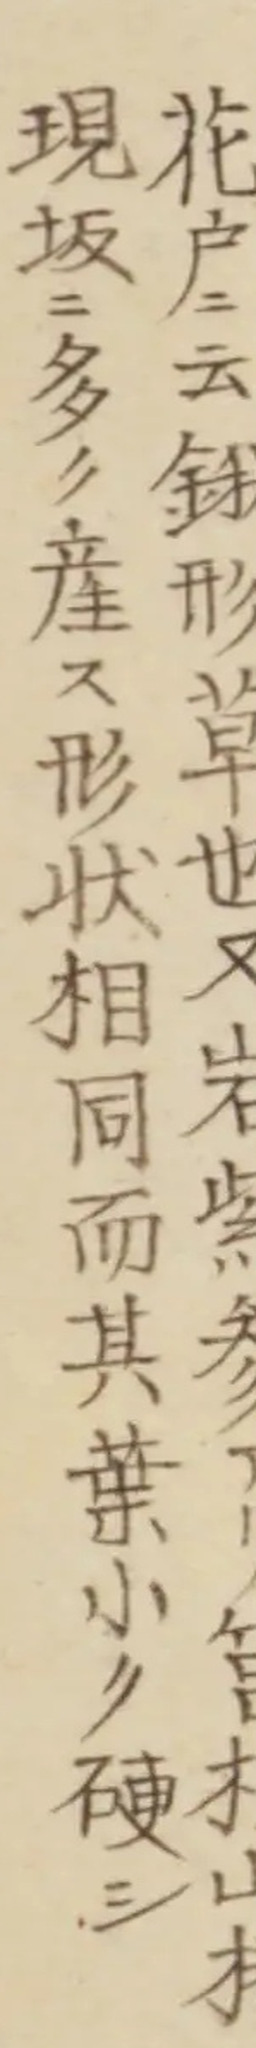現坂ニ多ク産ス形状相同而其葉小ク硬シ

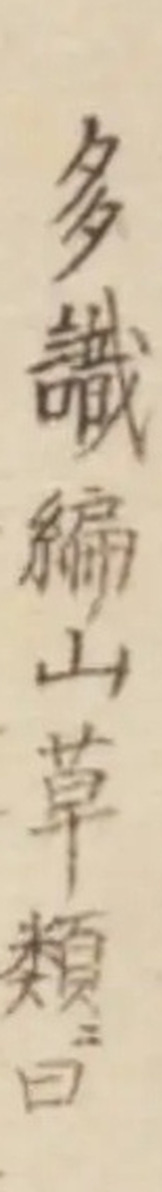多識編山草類ニ曰
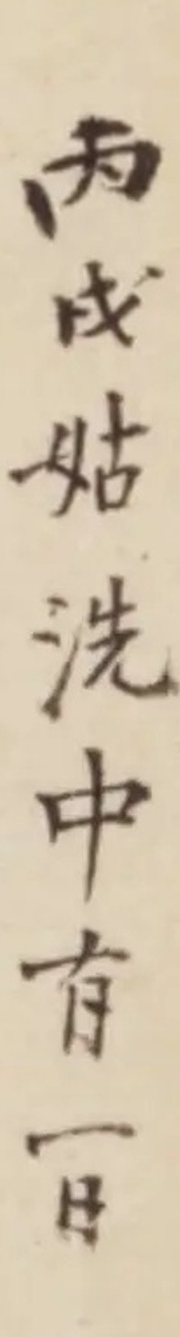丙戌姑洗中有一日
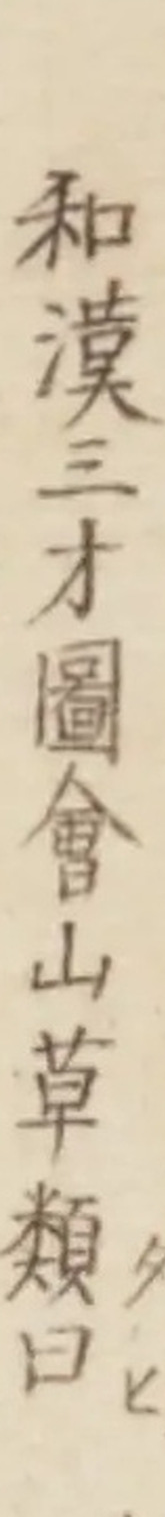和漢三才圖會山草類ニ曰
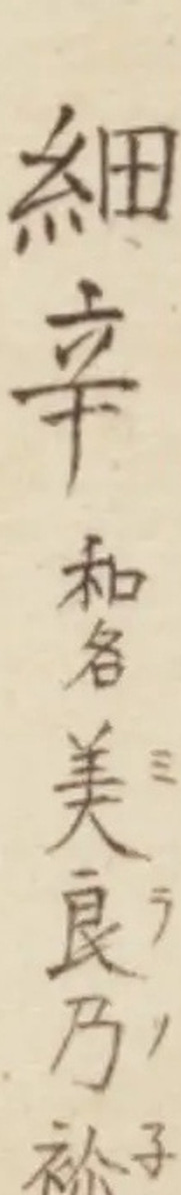細辛和名美良乃祢
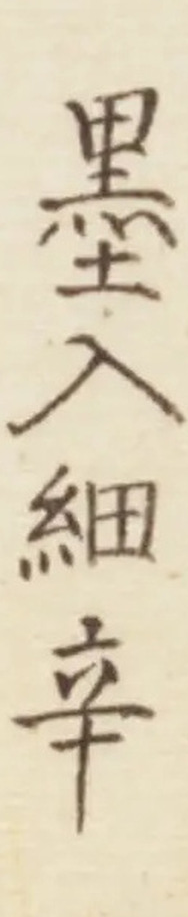墨入細辛
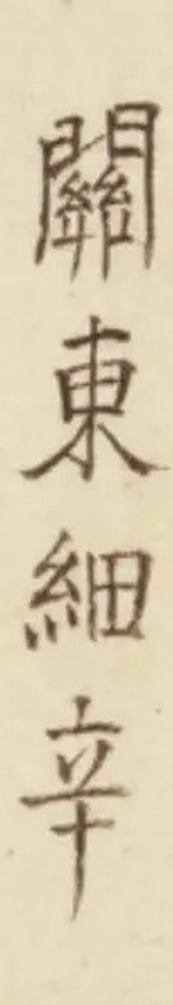關東細辛

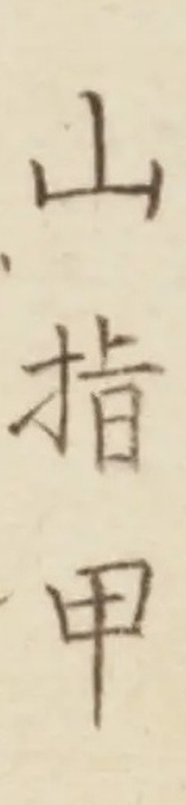山指甲
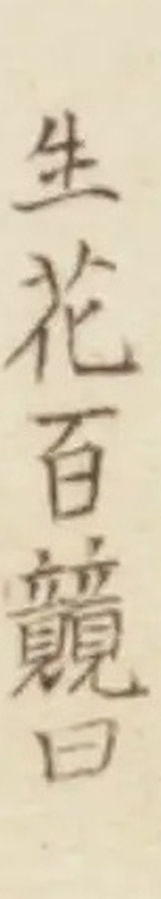生花百競曰
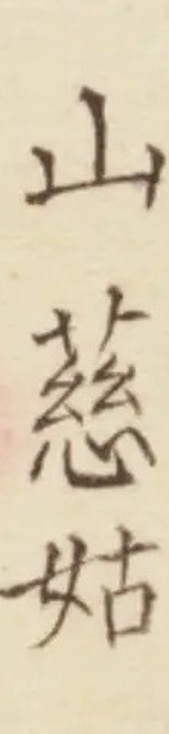山慈姑
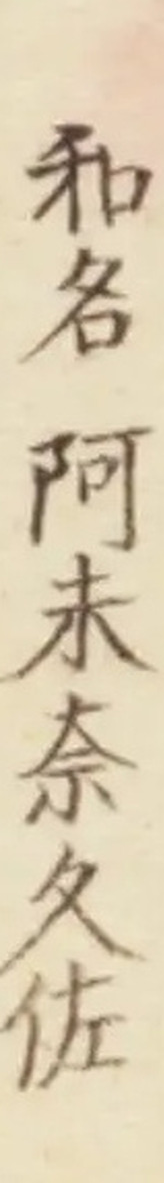和名阿未奈久佐
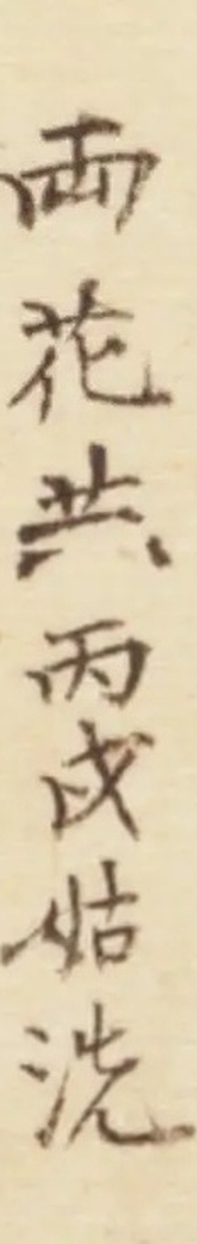両花丙戌姑洗
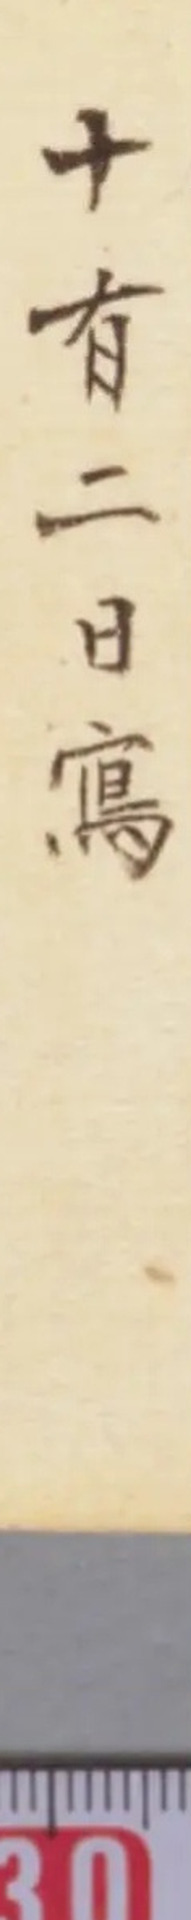十有二日寫
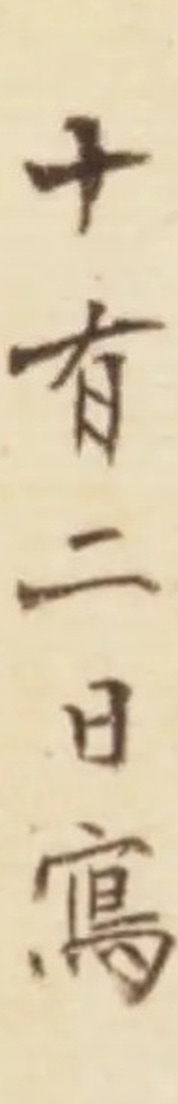十有二日寫
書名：梅園草木花譜春之部. 3
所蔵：国立国会図書館 National Diet Library, JAPAN
